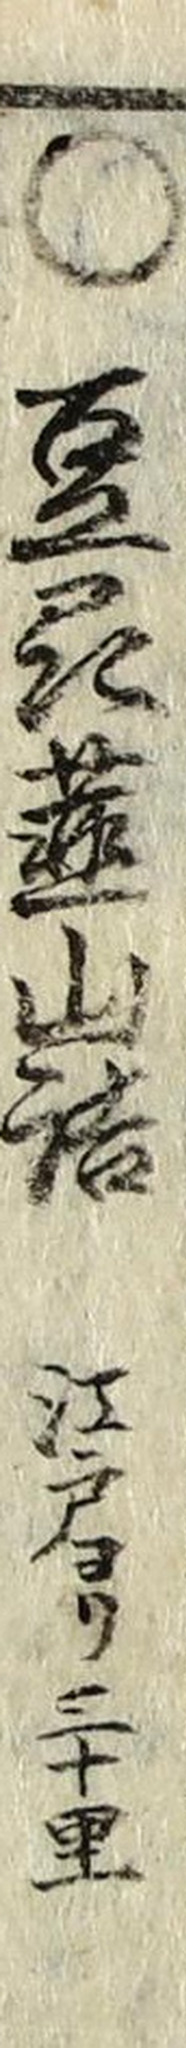○豆州韮山詰江戸ヨリ三十里
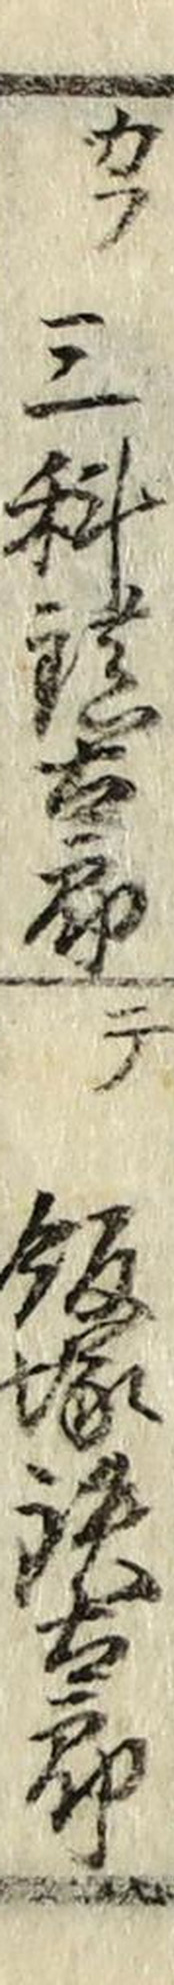カク三科鎮太郎テ飯塚鉄太郎
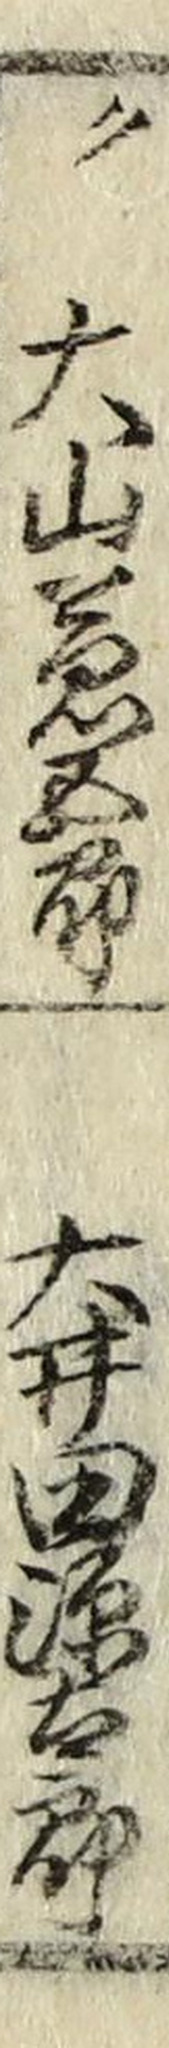ク大山兼五郎大井田源太郎
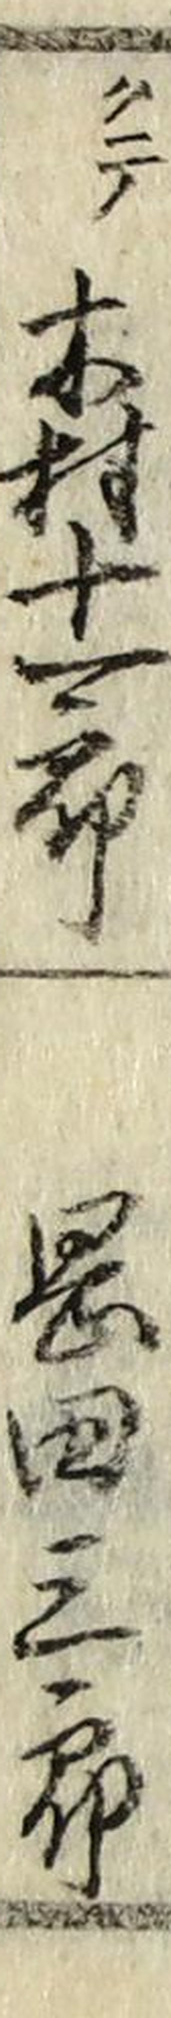クテ木村十一郎岡田三郎
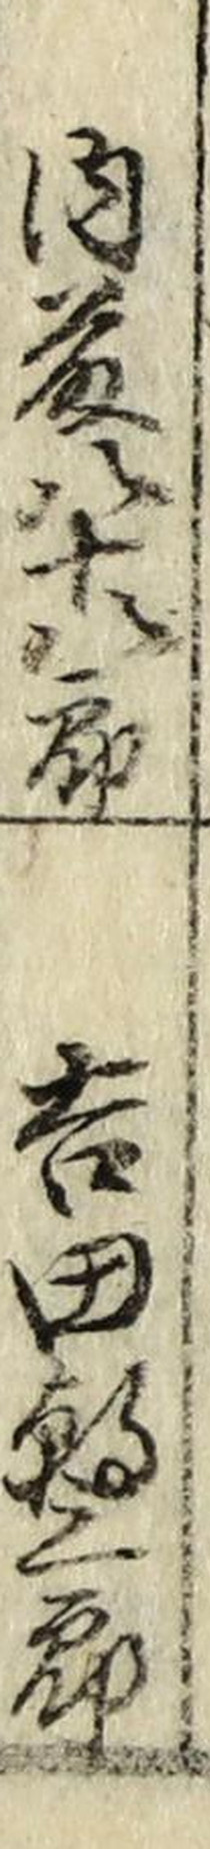内藤八十八郎吉田朝二郎
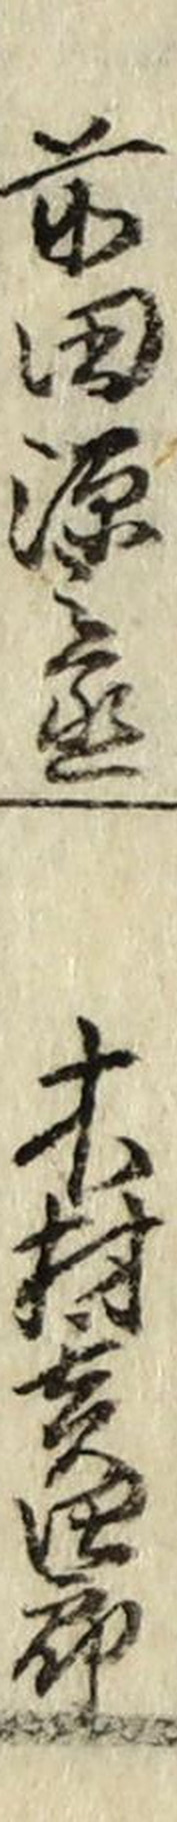前田源之丞木村亥田郎
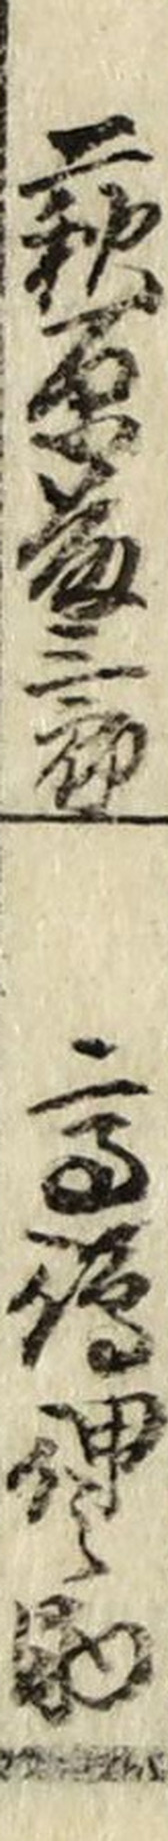萩原藤三郎高嶋押之助
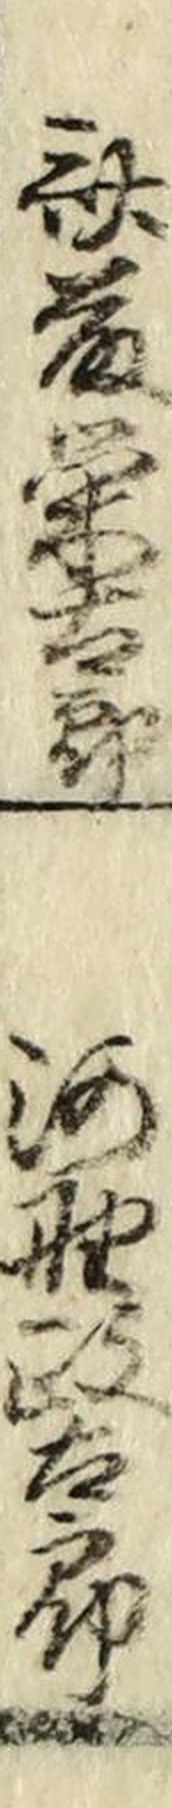斉藤栄太郎河野政太郎
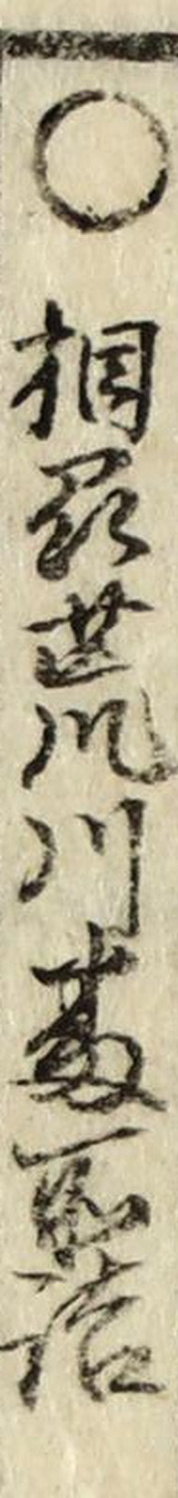○相州荒川番所詰
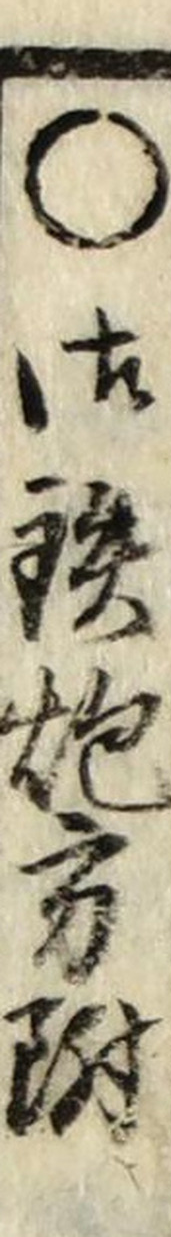○御鉄砲方附
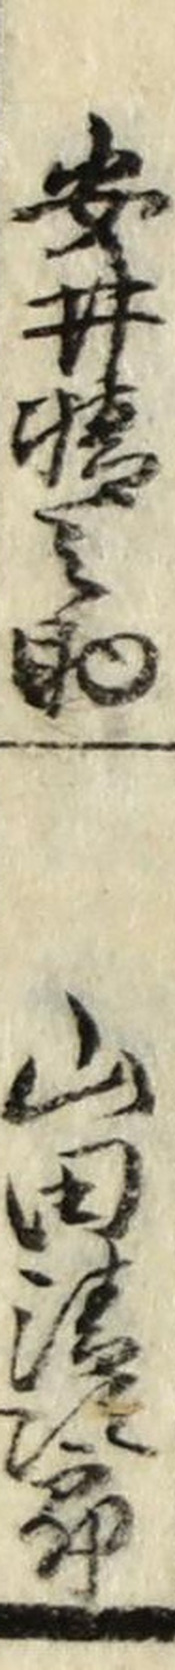安井慎之介山田清次郎
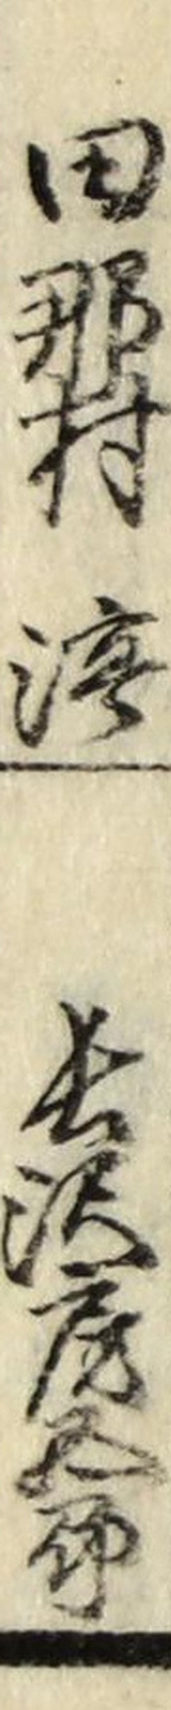田那村渟長沢房五郎

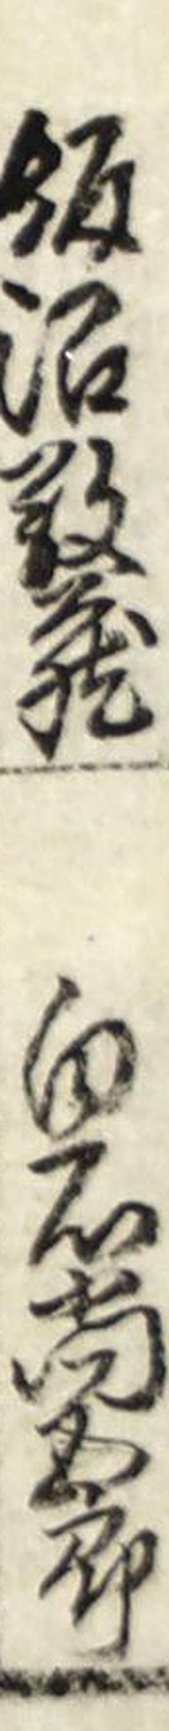飯沼致蔵白石尚五郎
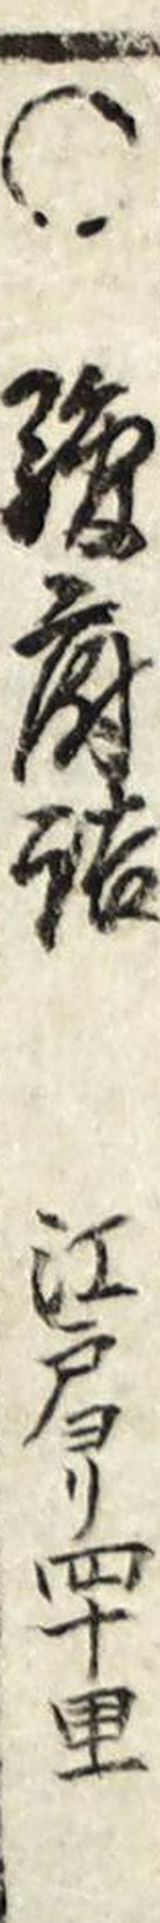○駿府詰江戸ヨリ四十里
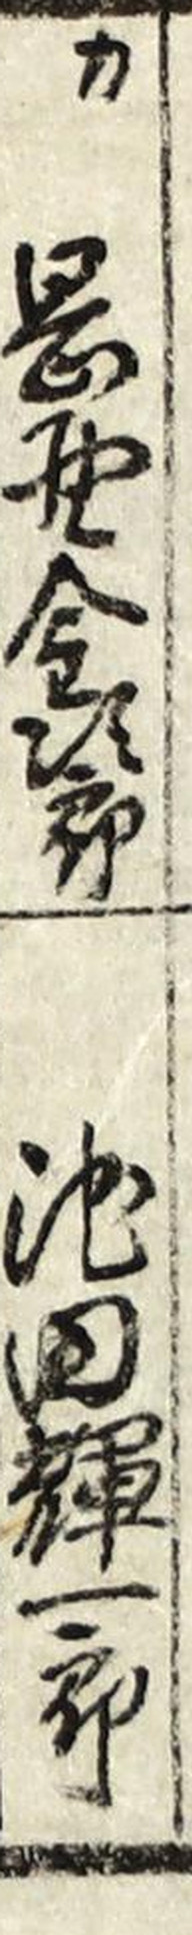カ岡野金次郎池田輝一郎
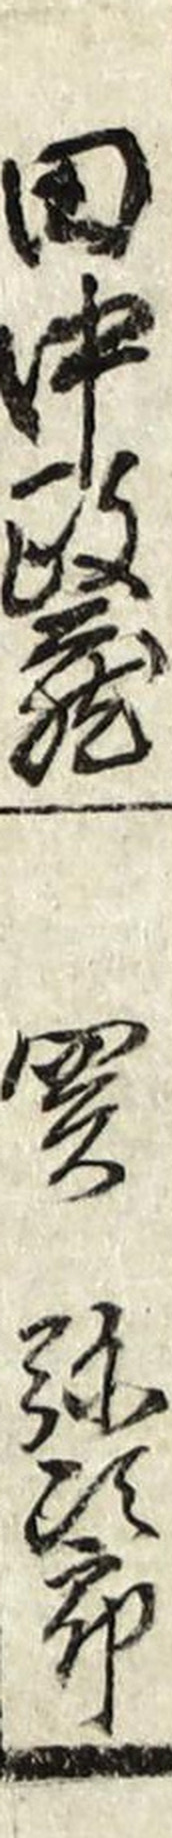田中政藏関弥次郎
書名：（全国郡代・代官所諸役人名列）
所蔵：福井県文書館 Fukui Prefectural Archives
